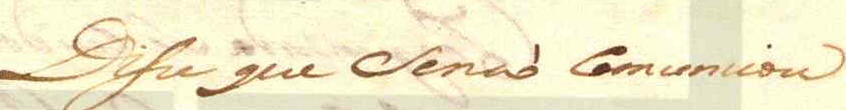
Disse que senaõ comunicou
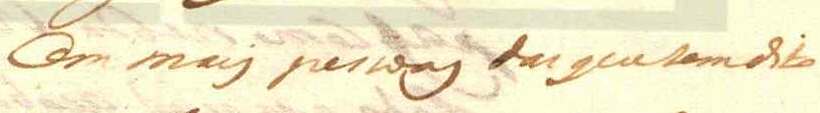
Com mais pessoas das que tem dito
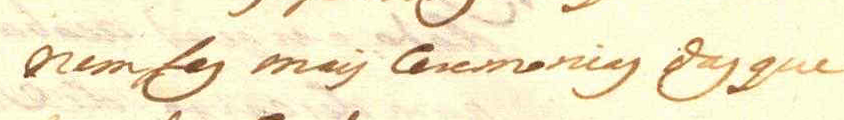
nem fes mais ceremonias das que
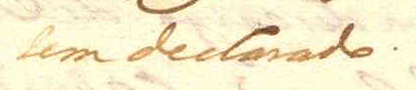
tem declarado.
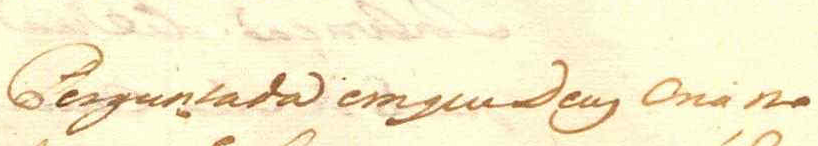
Perguntada em que Deus cria no
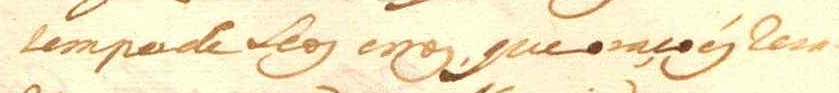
tempo de seos erros, que oraçoẽs Reza
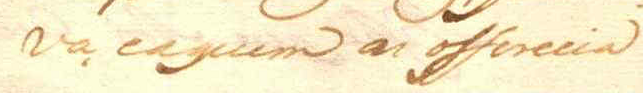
va e quem as offerecia
